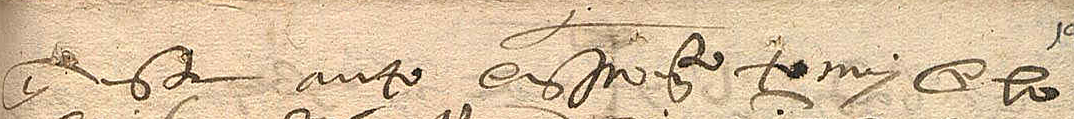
q̄ este auto e estromto tomej ē ho
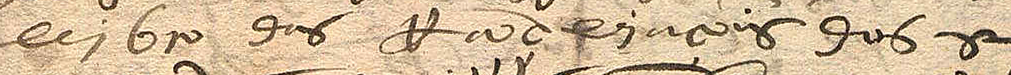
lljvro das Recōciliaçoĩs dos se
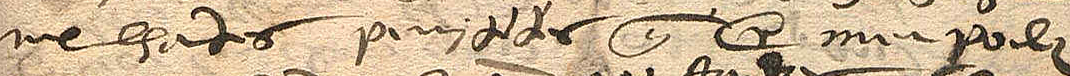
melhātes penjtētes q̄ ē meu poder
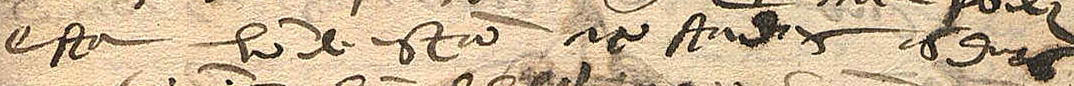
esta hōde estaõ acostadas as duas
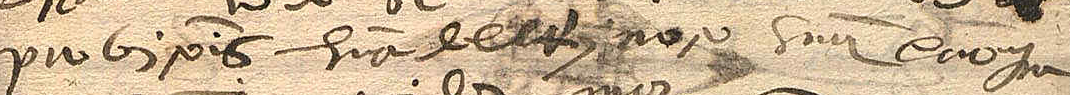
provisoĩs hūa dell Rej noso Sn̄or e a outra
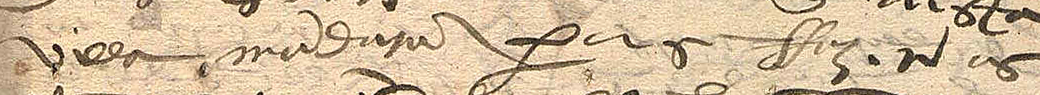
villa mādaraõ ꝑa se ffazerē as
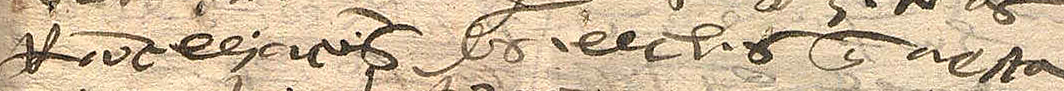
Recōcilljaçoĩs dos ellches q̄ a esta
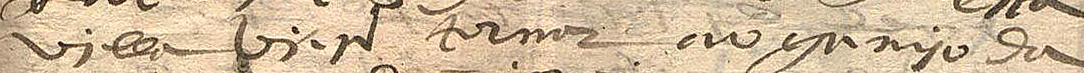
villa vierē tornar ao gremjo da
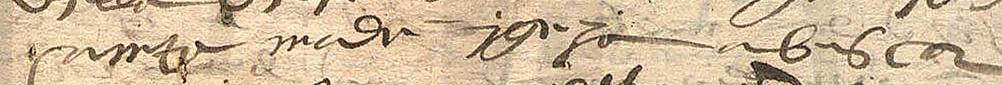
samta madre jgreJa a buscar
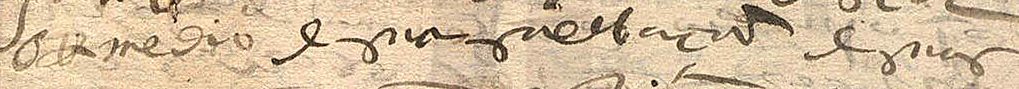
o Remedio de sua sallvaçaõ de suas
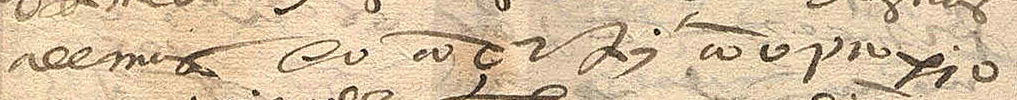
allmas e o c̄ocertej c̄o o propio
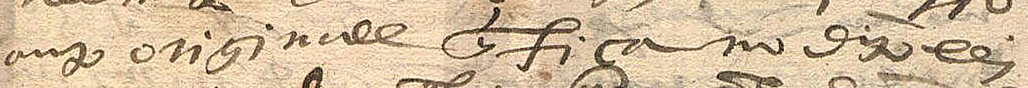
auto originall q̄ fica no dit̄o llj
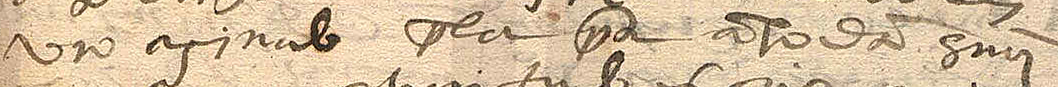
vro asinado p̄la p̄te cō o dtō snor̄
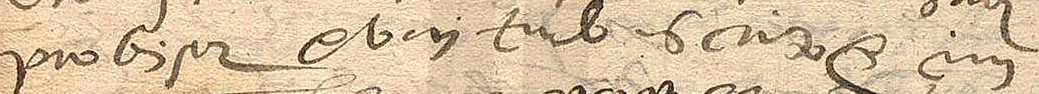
provisor e vaj tudo escrito ē cim
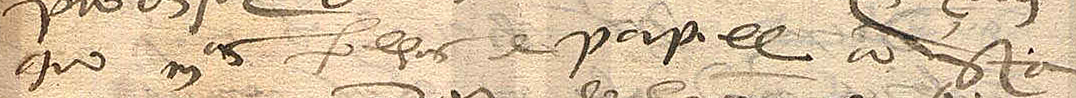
quo mas folhas de papell cō esta
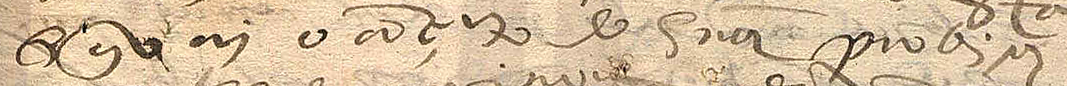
ē q̄ vaj o c̄ocerto do Snōr provjsor
